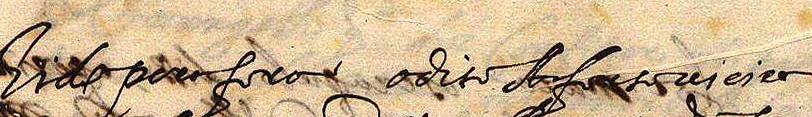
E ido pera fora o dito Afonso uieira
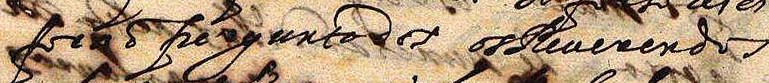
foraõ perguntados os Reuerendos
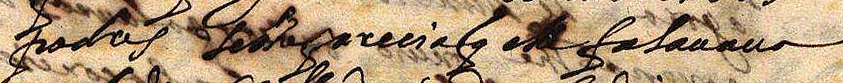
padres se lhe parecia q̄ elle falauaua
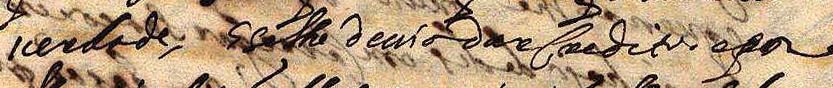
uerdade, E se lhe deuia dar Credito e por
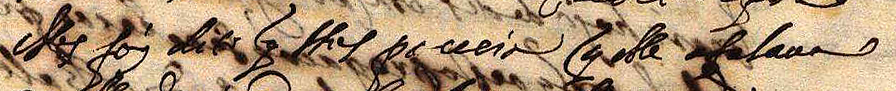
elles foy dito q̄ lhes parecia q̄ elle o falaua
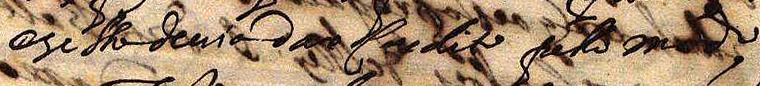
e se lhe deuia dar Credito pello modo
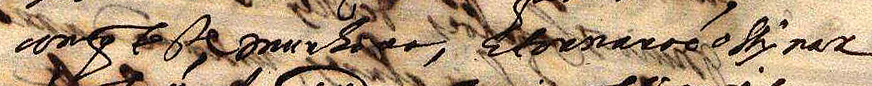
com q̄ testemunhaua, e tornaraõ assynar
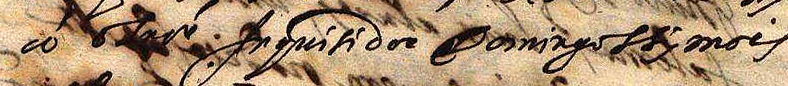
cō o snor̄ Jnquisidor Domingos symois
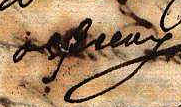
o escreuy
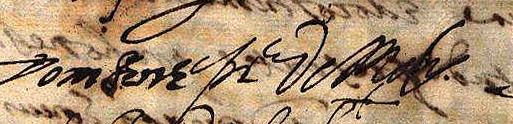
Dom Anto pra de Men̄s
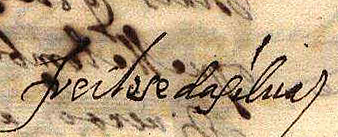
frei Iose da silua
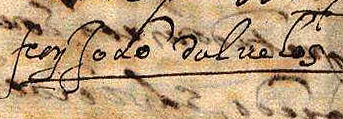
frey Joaõ daluelos
